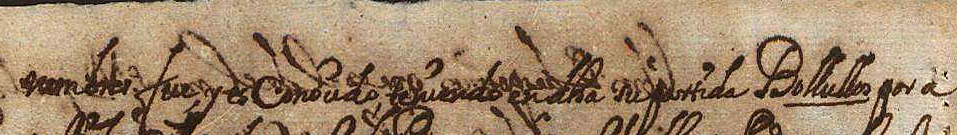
nombres fue, y es Conocido, teniendo en dha su partida Bollullos por a
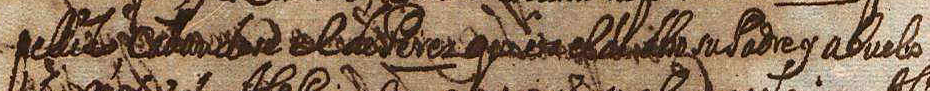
pellido, Callandose el de Perez que era el de dho su Padre y abuelo
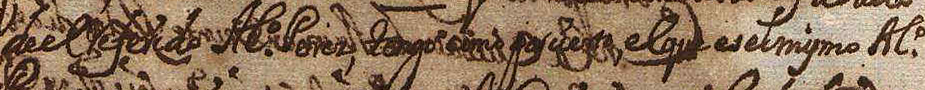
de el Referido Al.o Perez, tengo como por cierto, el que es el mismo Al.o
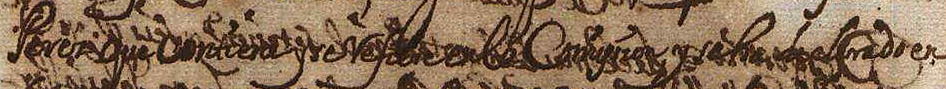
Perez que contiene y se Refiere en la Comission, y se ha declarado en
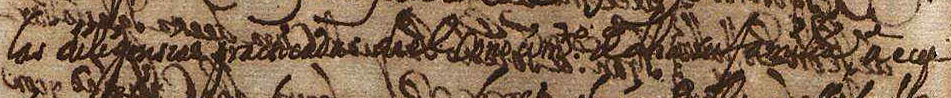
las diligensias practicadas de el conocim.to de dha su familia, â ecep
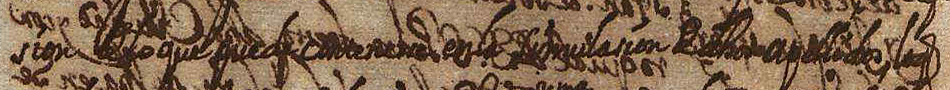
sion de lo que puede contenerse en la simulasion de dho apellido, lo q̄
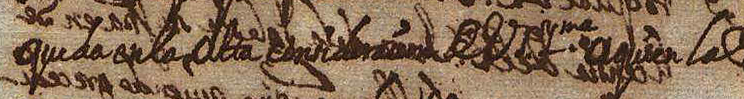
queda en la alta consideracion de V S Y.ma a quien la
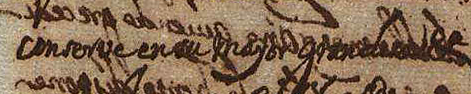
conserve en su mayor grandeza &a
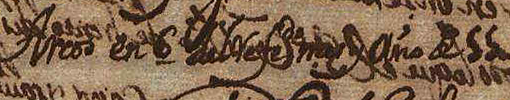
Arcos en 6 del Refedo mes y año de 55
